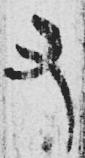又（有）
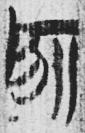所
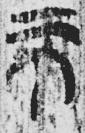不
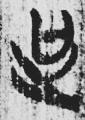足
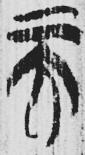而
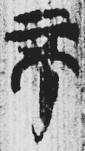不
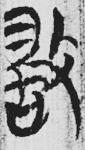敢
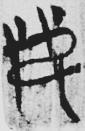弗
